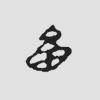畜
